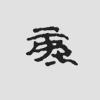坪
